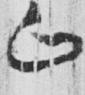㠯（以）
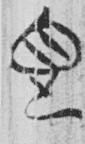見
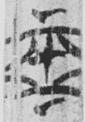亞（惡）
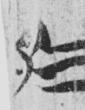於
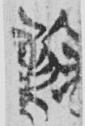厲厲
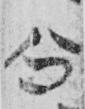公公
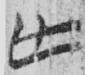亡（無）
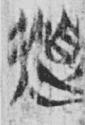道
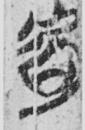虐
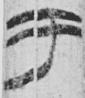于
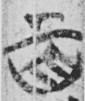百百
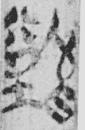豫豫
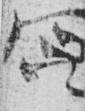反
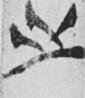之
